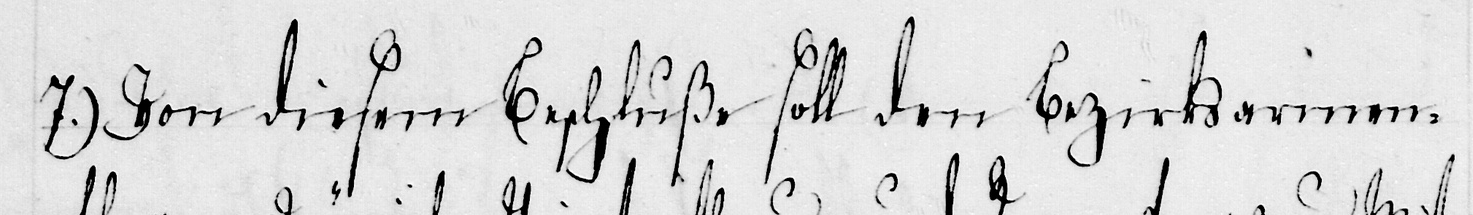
7.) Von diesem Beschluße soll den Bezirksarmen¬
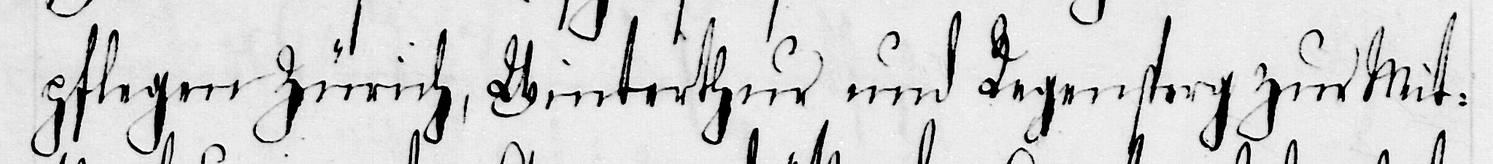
pflegen Zürich, Winterthur und Regensperg zur Mit¬
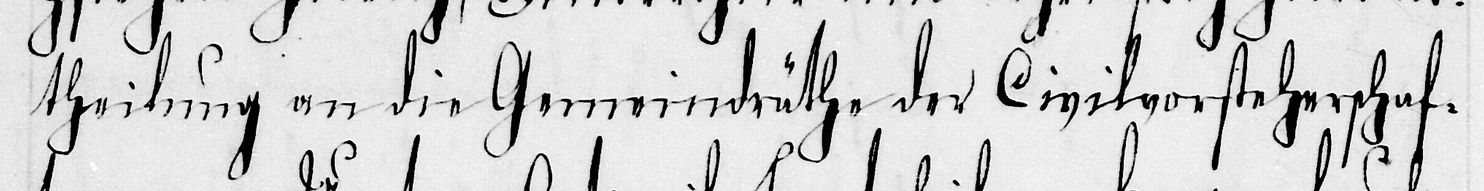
theilung an die Gemeindräthe der Civilvorsteherschaf¬
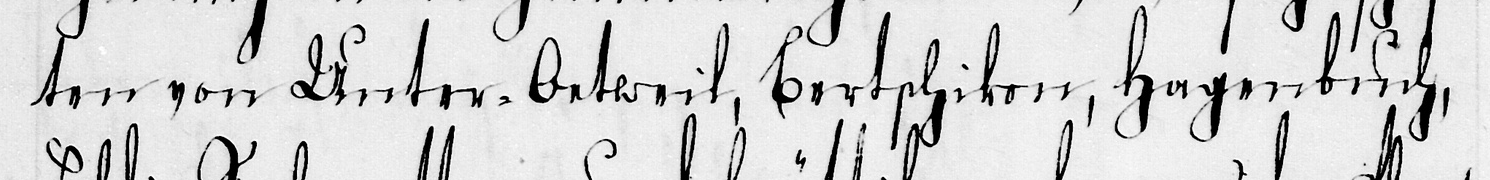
ten von Unter-Oetweil, Bertschikon, Hagenbuch,
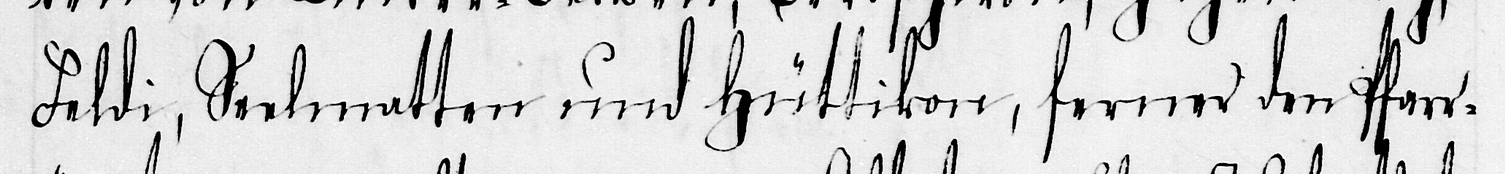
Feldi, Seelmatten und Hüttikon, ferner den Pfar¬
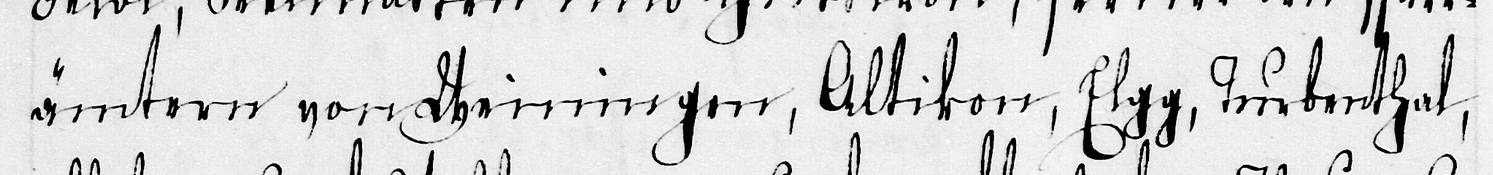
rämtern von Weiningen, Altikon, Elgg, Turbenthal,
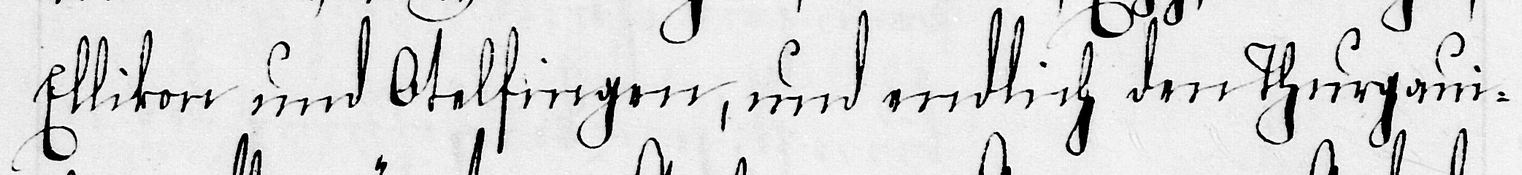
Ellikon und Otelfingen, und endlich den Thurgaui¬
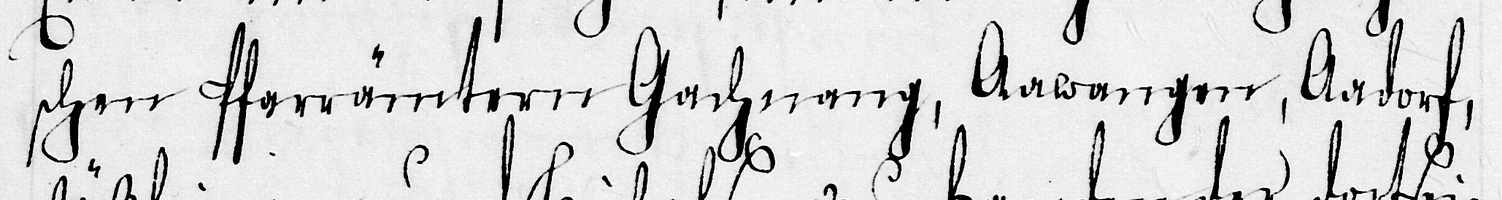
schen Pfarrämtern Gachnang, Aawangen, Aadorf,
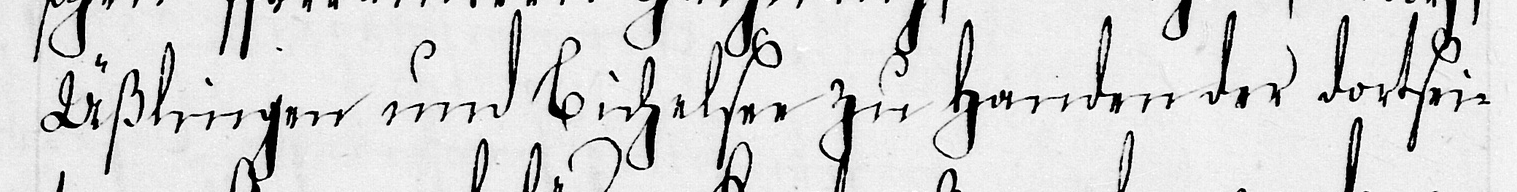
Üßlingen und Bichelsee zu Handen der dortsei¬
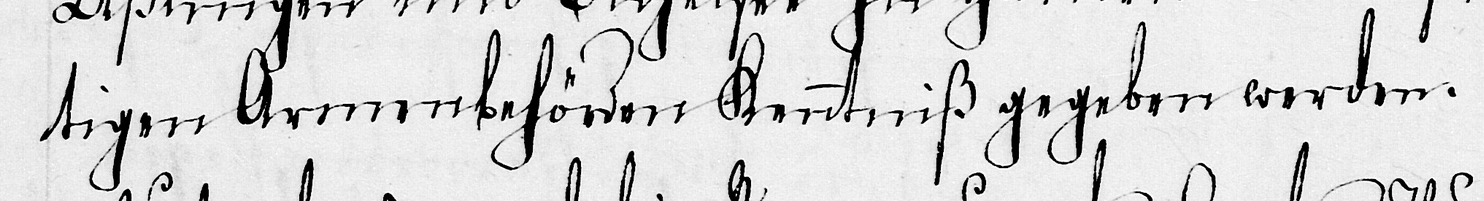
tigen Armenbehörden Kenntniß gegeben werden.
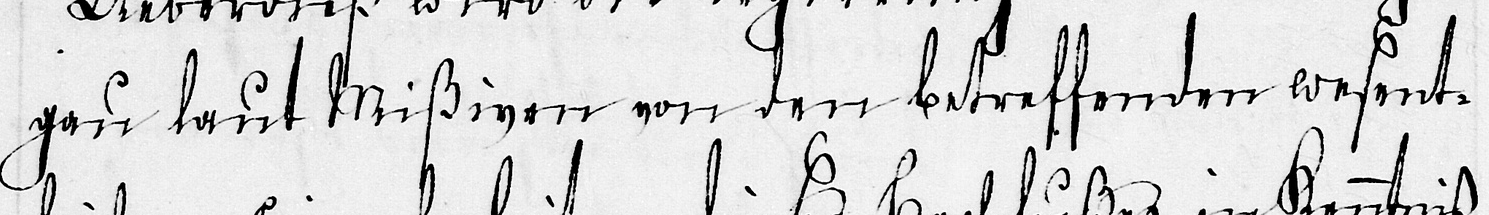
gau laut Mißiven von den betreffenden wesent¬
